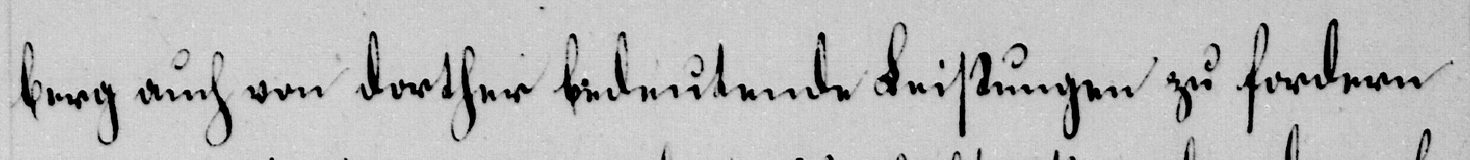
berg auch von dorther bedeutende Leistungen zu fordern
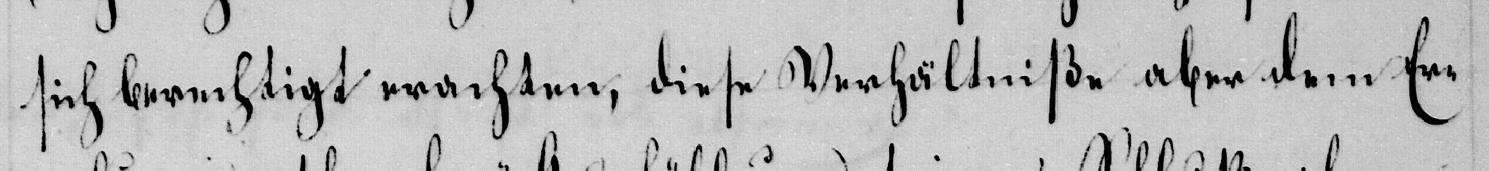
sich berechtigt erachten, diese Verhältniße aber dem Er¬
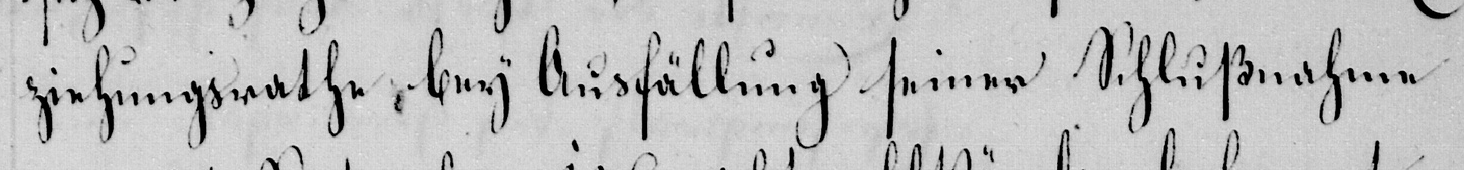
ziehungsrathe bey Ausfällung seiner Schlußnahme
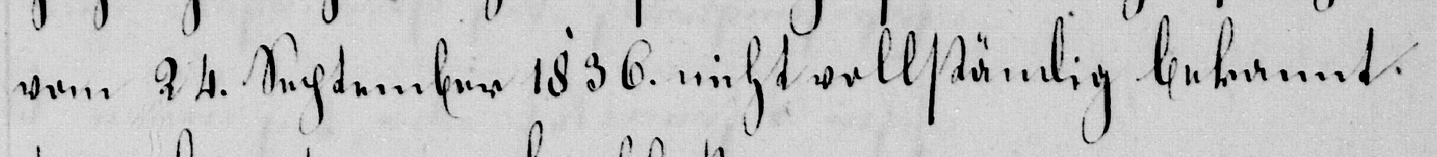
vom 24. September 1836. nicht vollständig bekannt
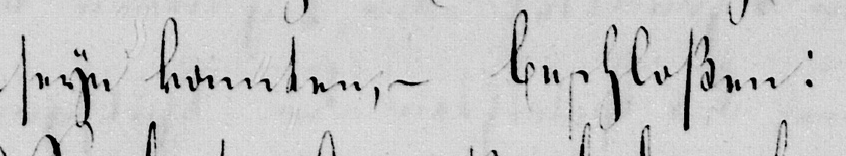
seyn konnten, beschloßen:
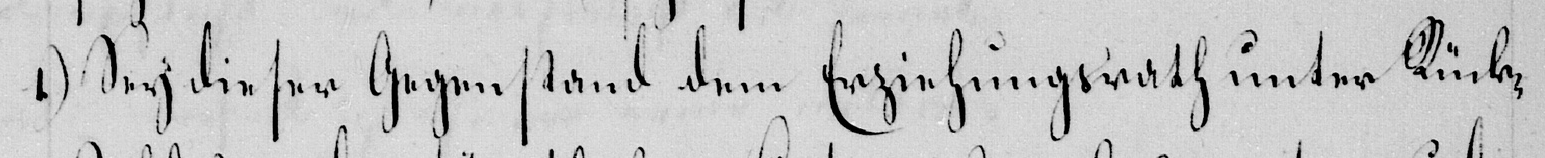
1.) Sey dieser Gegenstand dem Erziehungsrath unter Rück¬
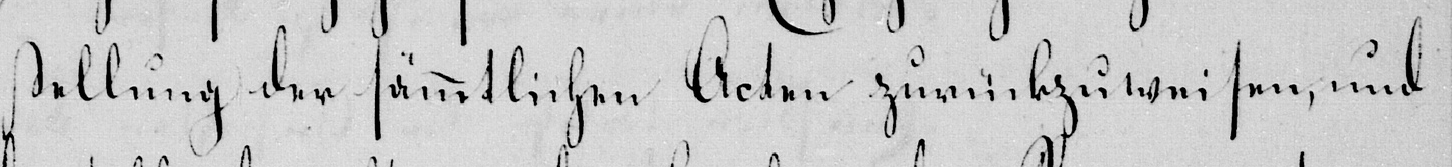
stellung der sämmtlichen Acten zurückzuweisen, und
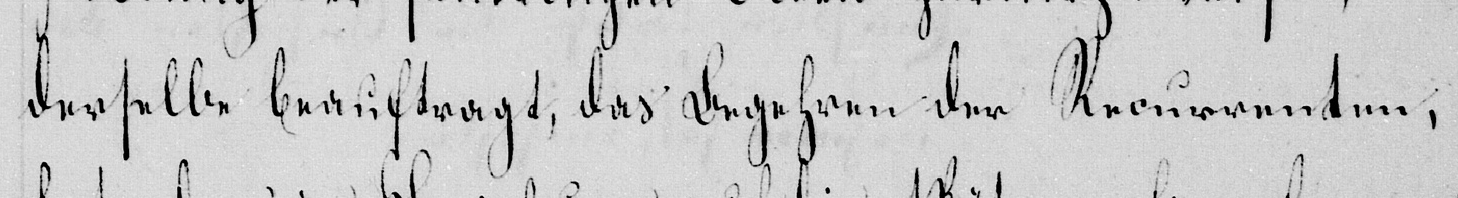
derselbe beauftragt, das Begehren der Recurrenten,
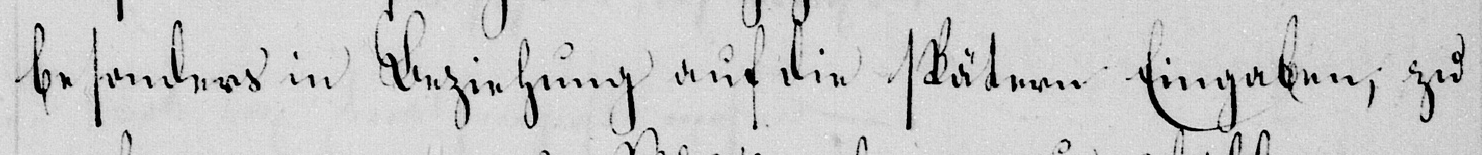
besonders in Beziehung auf die späteren Eingaben, zu
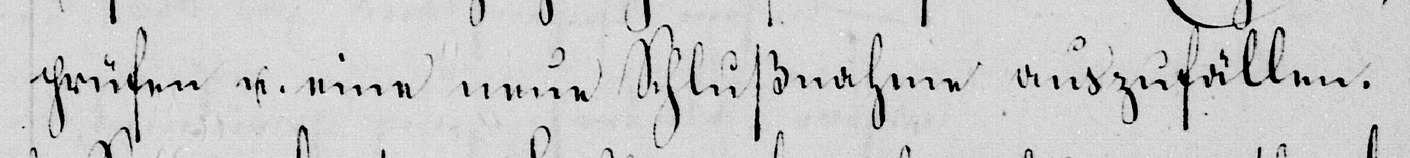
prüfen u. eine neue Schlußnahme auszufällen.
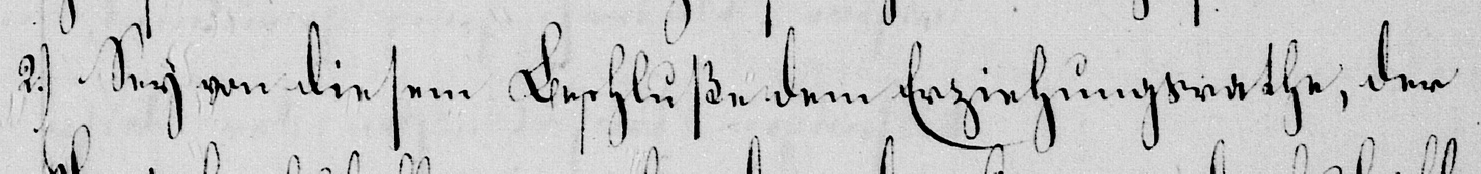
2.) Sey von diesem Beschluße dem Erziehungsrathe, der
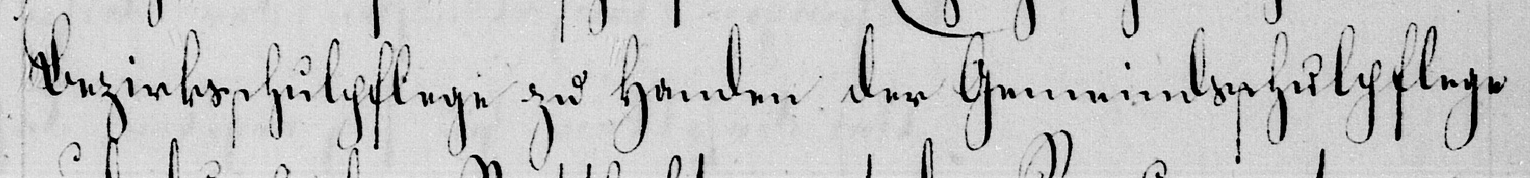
Bezirksschulpflege zu Handen der Gemeindsschulpflege
